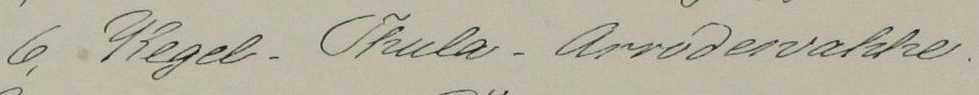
6. Kegel-Thula-Arrodewahhe.
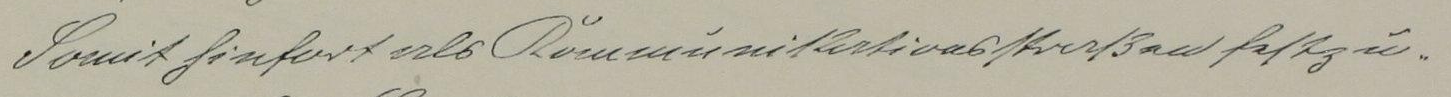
Somit hinfort als Kommunikationsstraßen festzu-
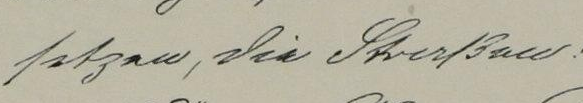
setzen, die Straßen:
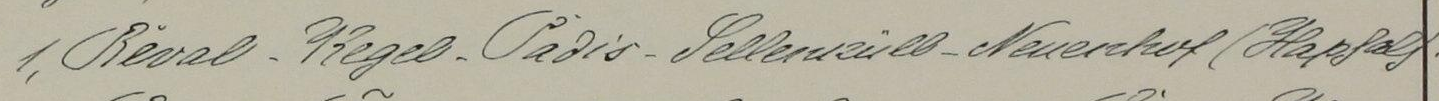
1. Reval-Kegel-Padis-Sellenküll-Neuenhof (Hapsal).
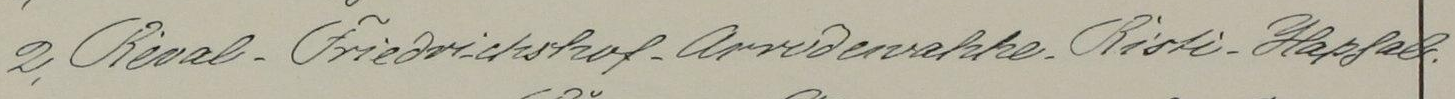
2. Reval-Friedrichshof-Arrodewahhe-Risti-Hapsal.
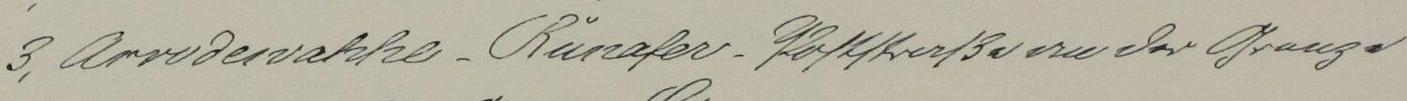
3. Arrodewahhe-Runafer-Poststraße an der Grenze
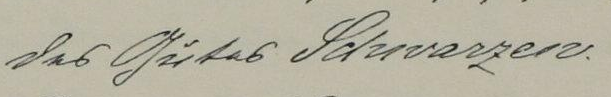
des Gutes Schwarzen.
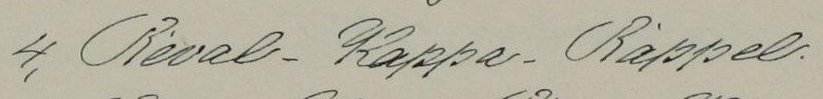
4. Reval-Kappa-Rappel.
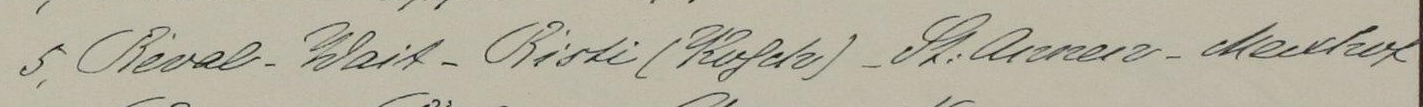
5. Reval-Wait-Risti (Kosch)-St. Annen-Mexhof
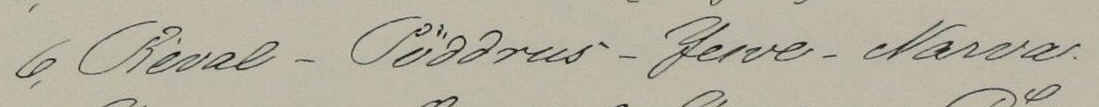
6. Reval-Pöddrus-Jewe-Narva.
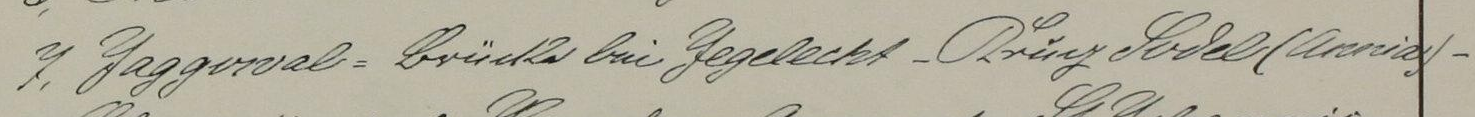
7. Jaggowal-Brücke bei Jegelecht-Krug Sodel (Annia)-
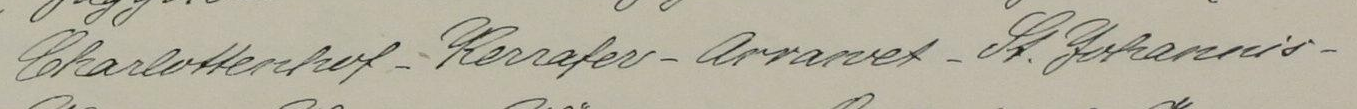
Charlottenhof-Kerrafer-Arrawet-St. Johannis-
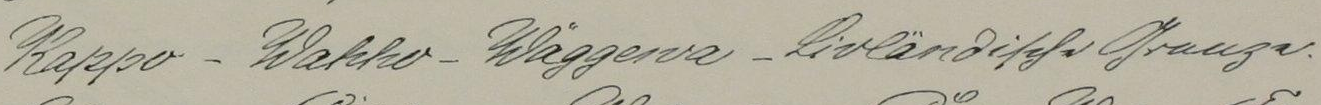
Kappo-Wahho-Wäggewa-Livländische Grenze.
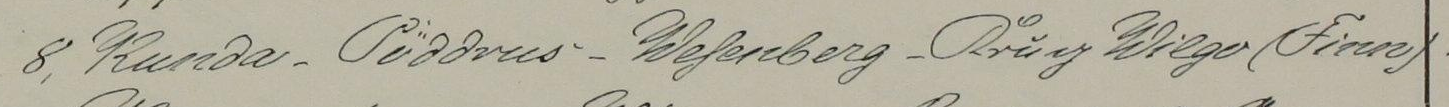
8. Kunda-Pöddrus-Wesenberg-Krug Wilgo (Finn)-
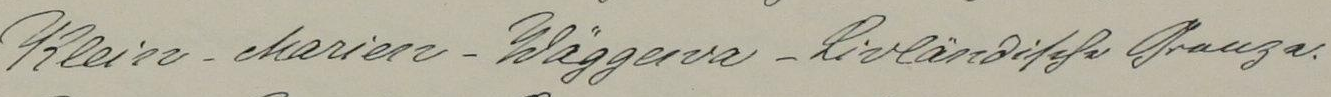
Klein-Marien-Wäggewa-Livländische Grenze.
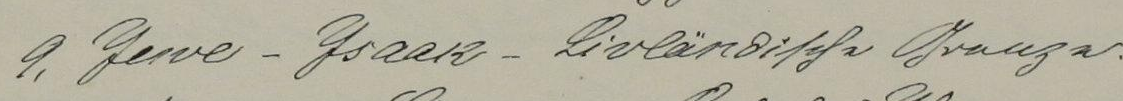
9. Jewe-Isaak-Livländische Grenze.
